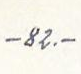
82
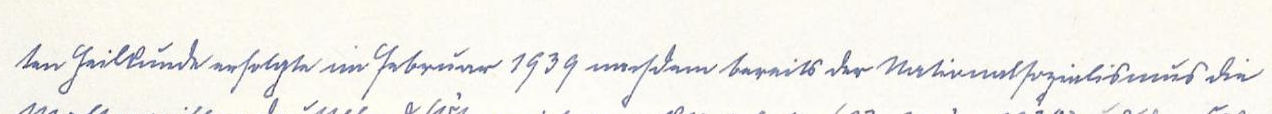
ten Heilkunde erfolgte im Februar 1939 nachdem bereits der Nationalsozialismus die
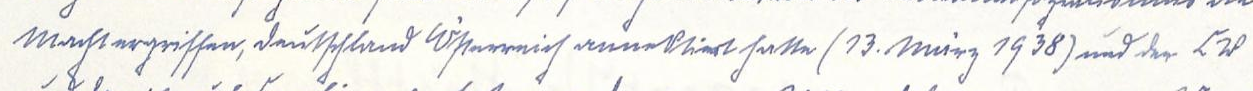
Macht ergriffen, Deutschland Österreich annektiert hatte (13. März 1938) und der CV
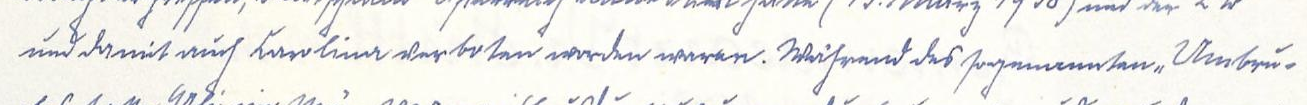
und damit auch Carolina verboten worden waren. Während des sogenannten „Umbru-
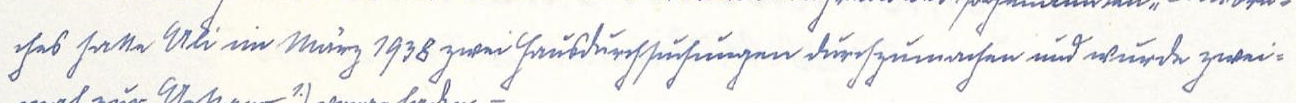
ches hatte Ali im März 1938 zwei Hausdurchsuchungen durchzumachen und wurde zwei-
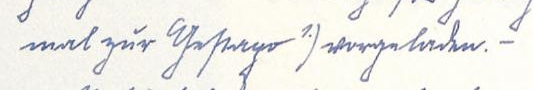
mal zur Gestapo 1) vorgeladen.
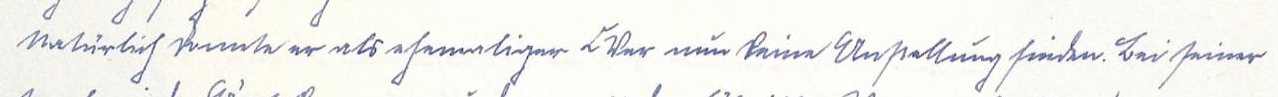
Natürlich konnte er als ehemaliger CVer nun keine Anstellung finden. Bei seiner
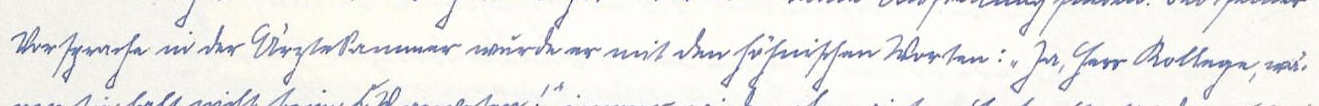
Vorsprache in der Ärztekammer wurde er mit den höhnischen Worten: "Ja, Her Kollege, wä-
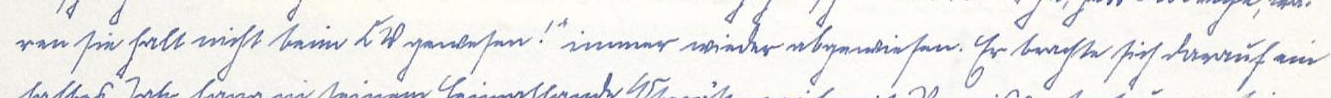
ren sie halt nicht beim CV gewesen!“ immer wieder abgewiesen. Er brachte sich darauf ein
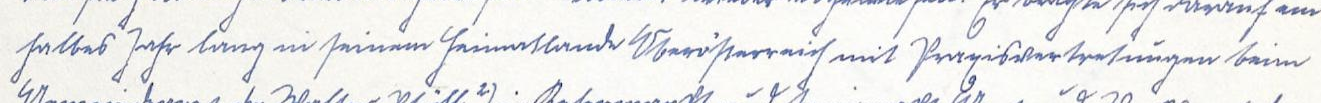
halbes Jahr lang in seinem Heimatlande Oberösterreich mit Praxisvertretungen beim
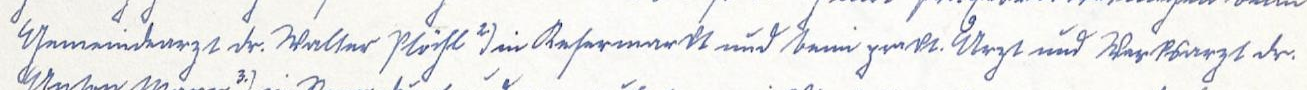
Gemeindearzt Dr. Walter Plöchl 2) in Kasermarkt und beim prakt. Arzt und Werksarzt Dr.
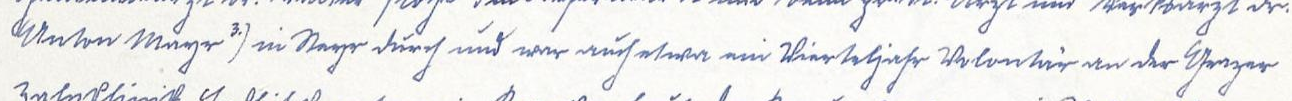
Anton Mayr 3) in Steyr durch und war auch etwa ein Vierteljahr Volontär an der Grazer
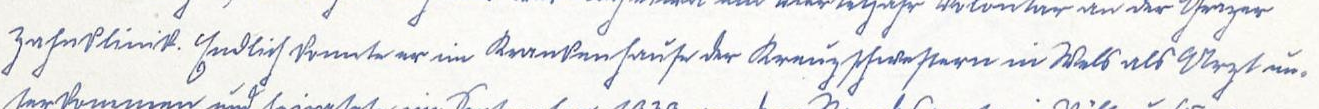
Zahnklinik. Endlich konnte er im Krankenhause der Kreuzschwestern in Wels als Arzt un-
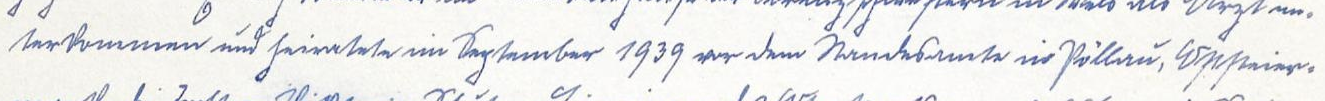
terkommen und heiratete im September 1939 vor dem Standesamte in Pöllau, Oststeier-
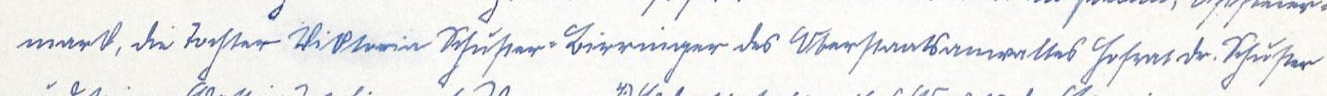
mark, die Tochter Viktoria Schuster- Birringer des Oberstaatsanwaltes Hofrat Dr. Schuster
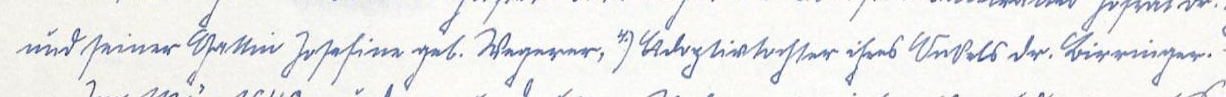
und seiner Gattin Josehine geb. Wegerer 4) Adoptivtochter ihres Onkels Dr. Birringer.-
